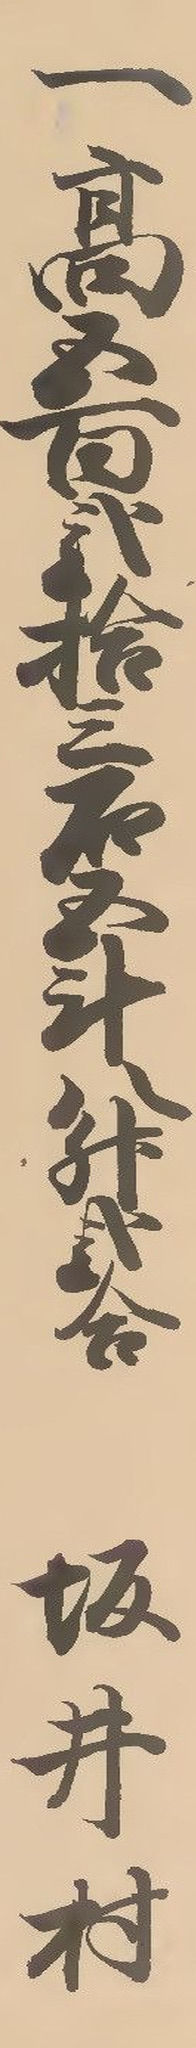一髙五百弐拾三石五斗八升壱合坂井村
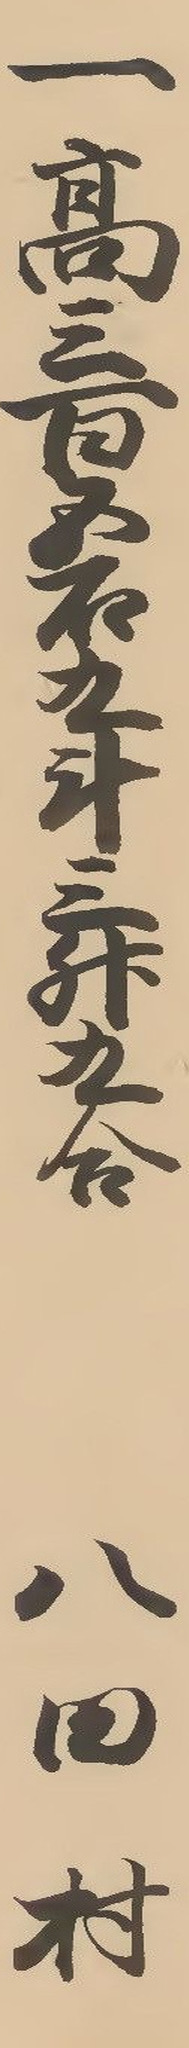一髙三百五石九斗三升九合八田村
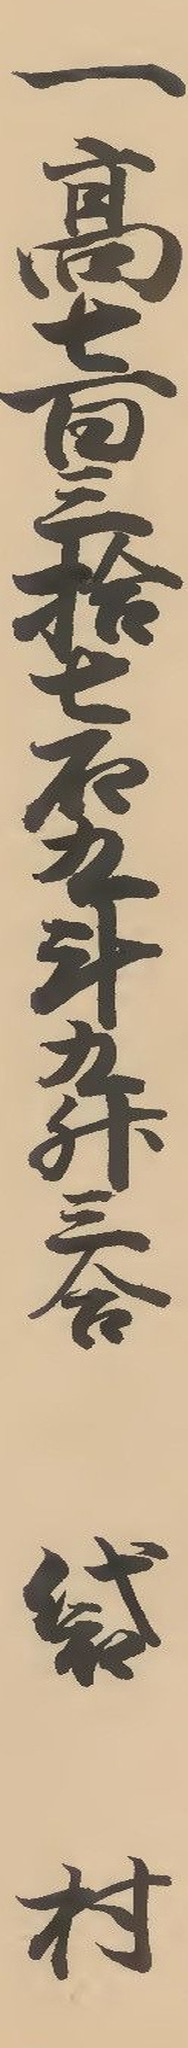一髙七百三拾七石九斗九升三合袋村
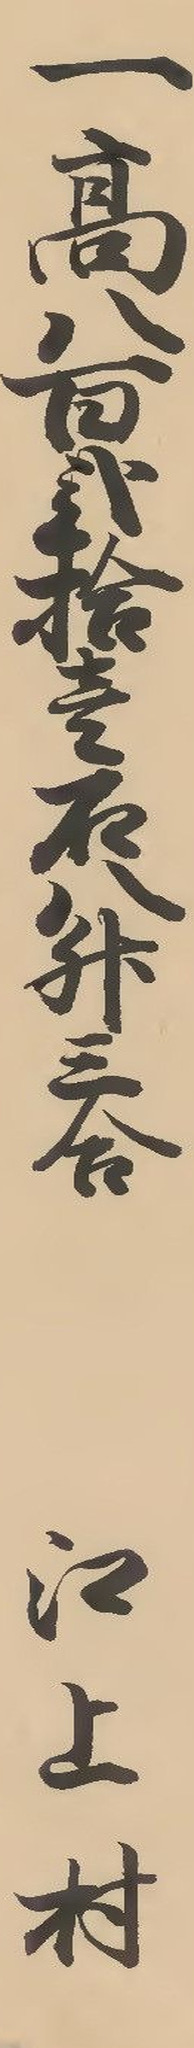一髙八百弐拾壱石八升三合江上村

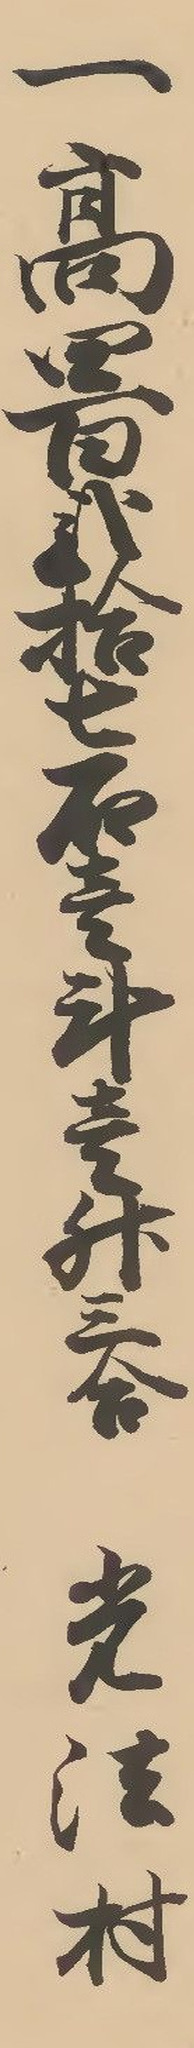一髙四百弐拾七石壱斗壱升三合光法村
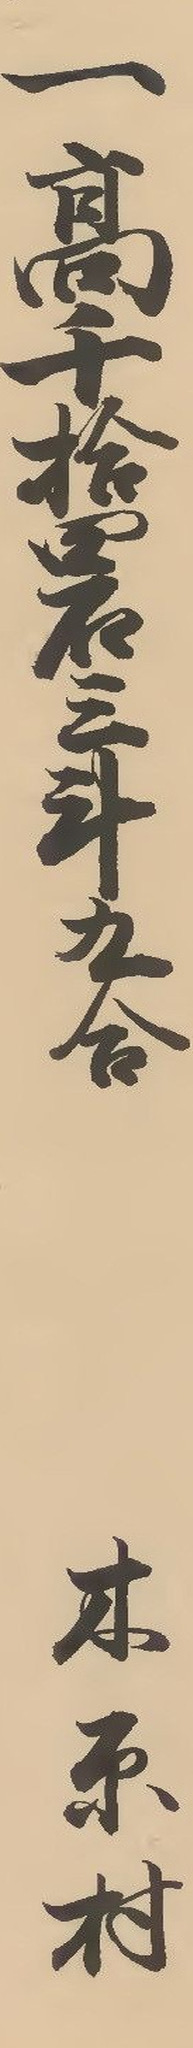一髙千拾四石三斗九合木原村
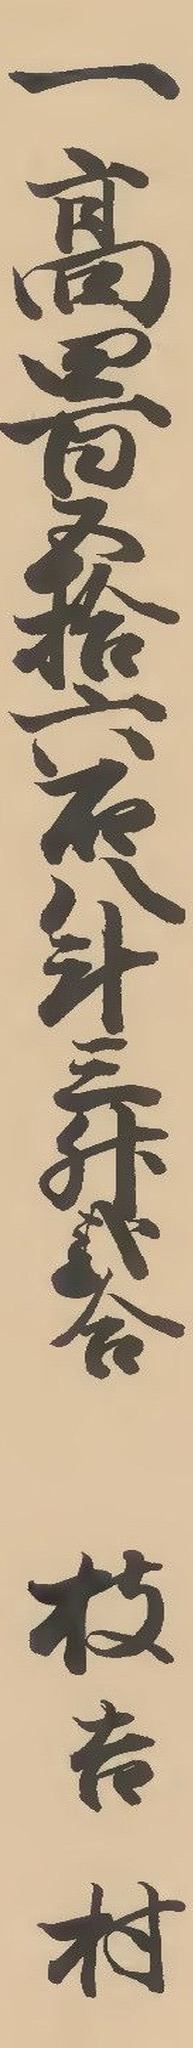一髙四百五拾六石八斗三升弐合枝吉村
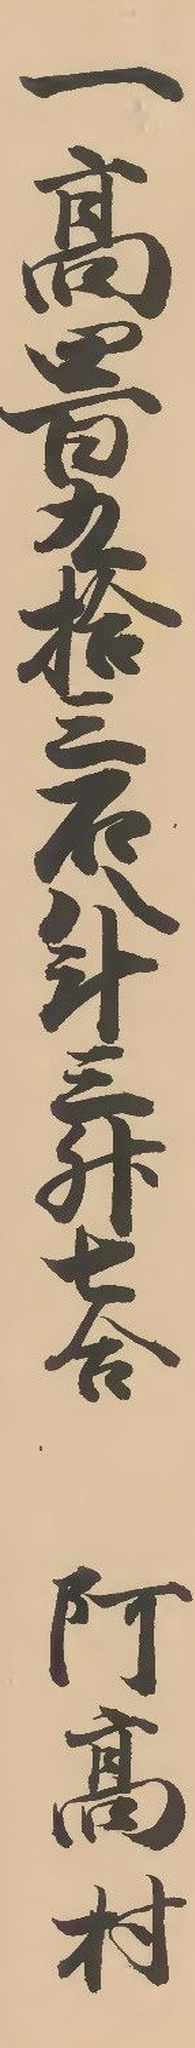一髙四百九拾三石八斗三升七合阿髙村
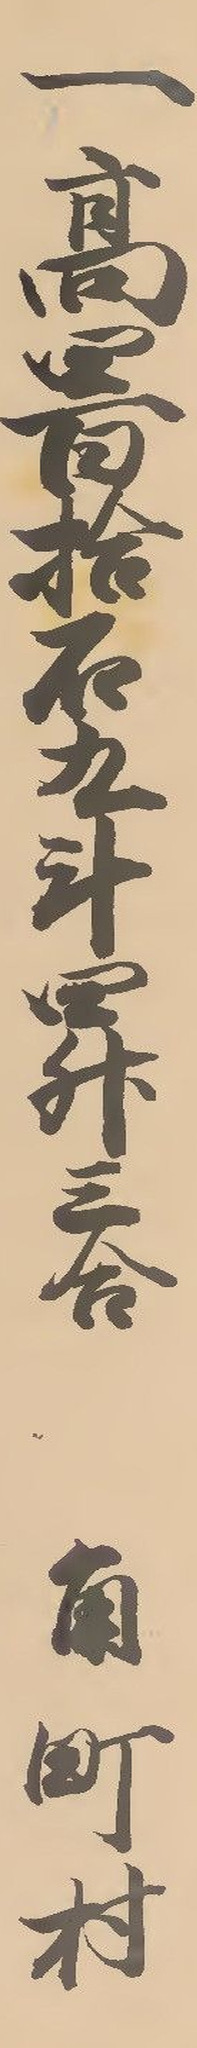一髙四百拾石九斗四升三合角町村
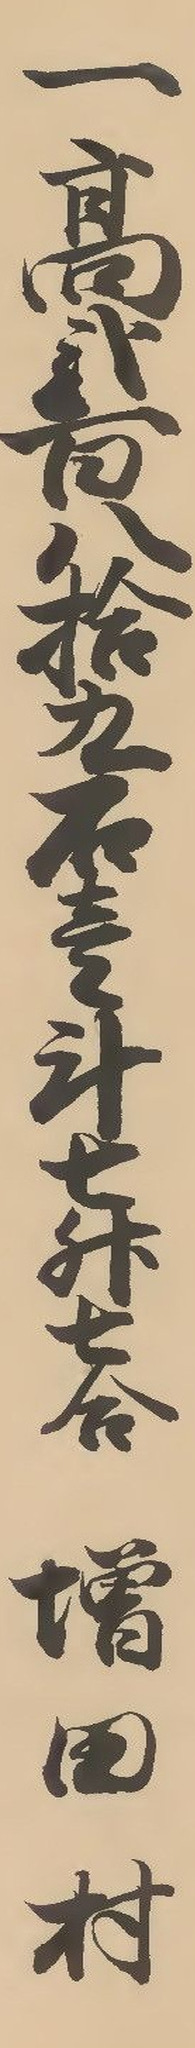一髙弐百八拾九石壱斗七升七合増田村
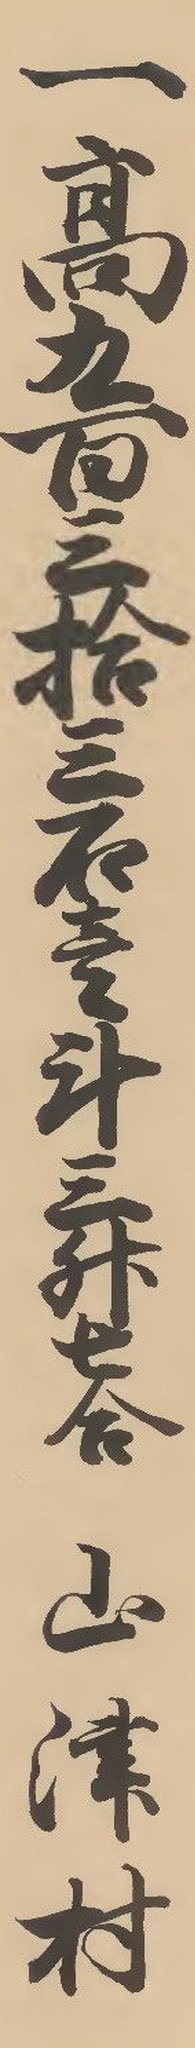一髙九百三拾三石壱斗三升七合山津村
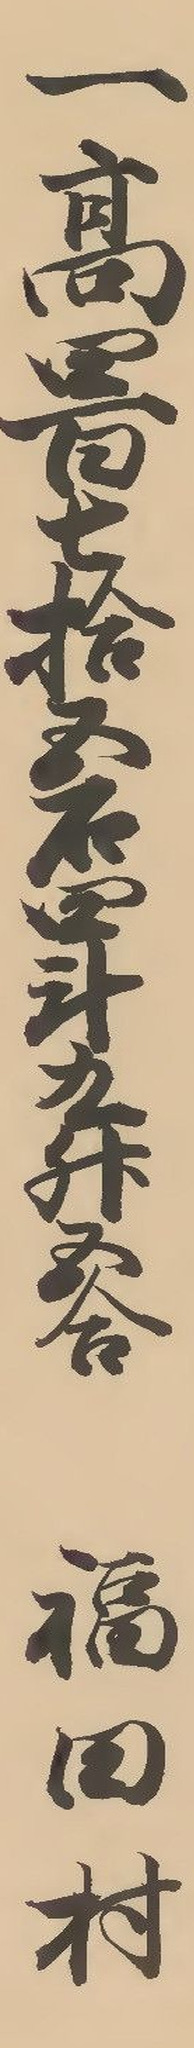一髙四百七拾五石四斗九升五合福田村

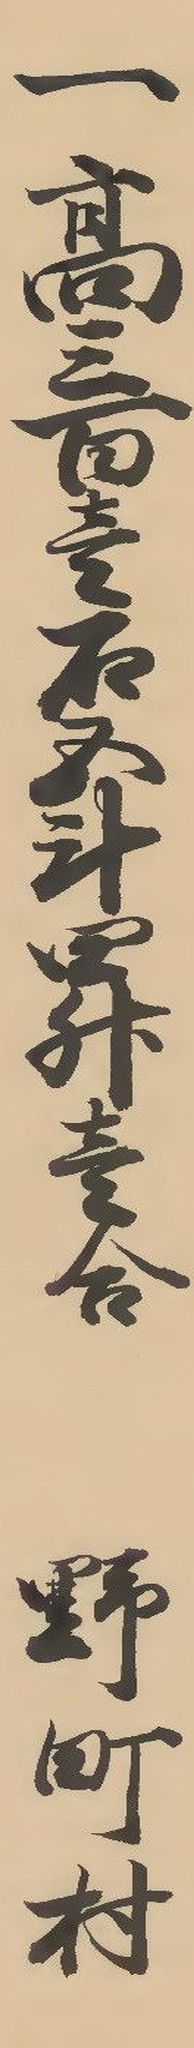一髙三百壱石五斗四升壱合野町村
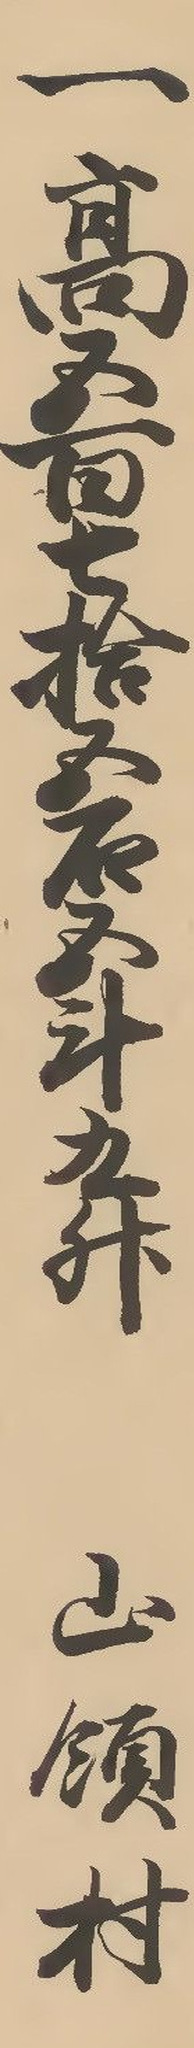一髙五百七拾五石五斗九升山領村
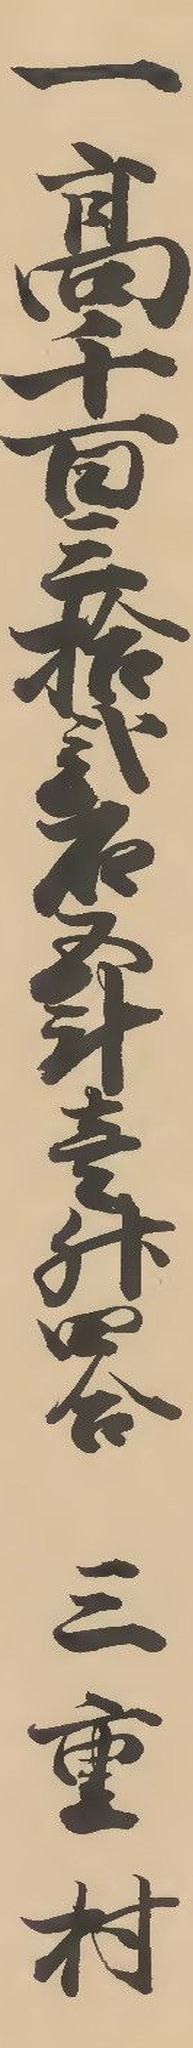一髙千百三拾弐石五斗壱升四合三重村
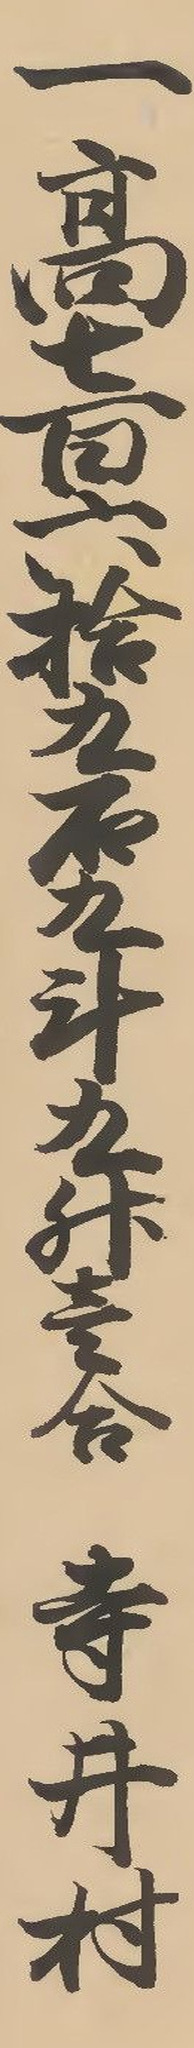一髙七百六拾九石九斗九升壱合寺井村
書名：肥前国郷帳
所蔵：国立公文書館 National Archives of Japan
